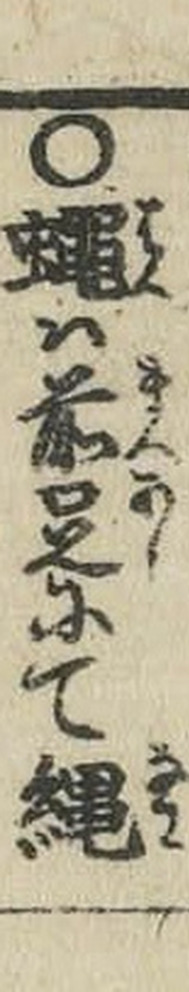○蠅は前足にて縄
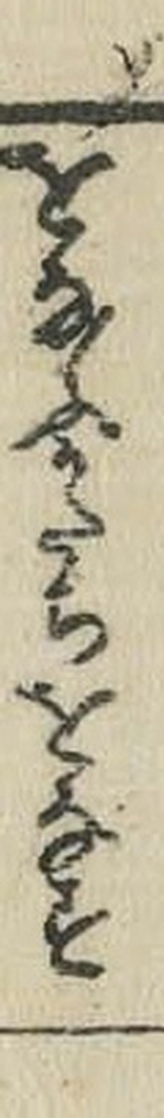をなふかたちをなす
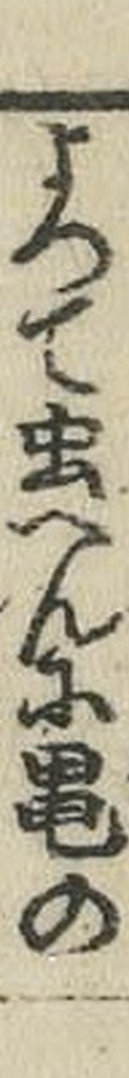よつて虫へんに黽の
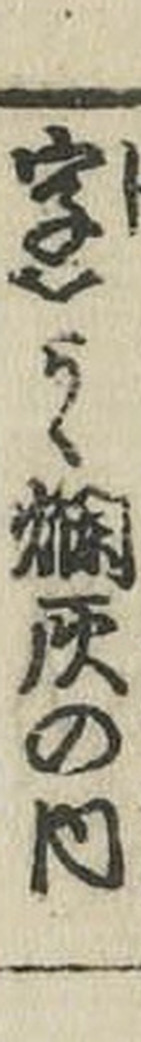字をかく爛灰の内
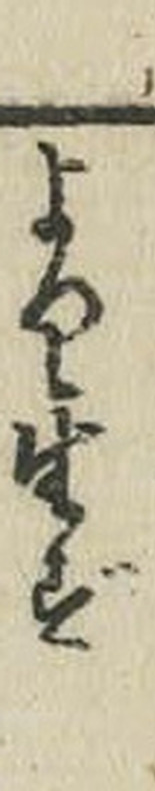より生ず
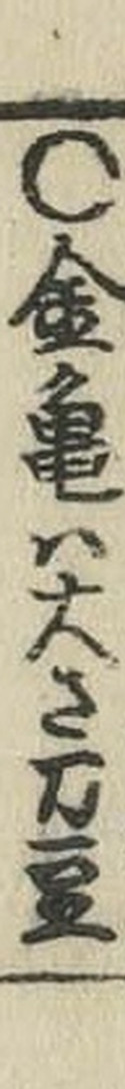○金亀は大さ刀豆
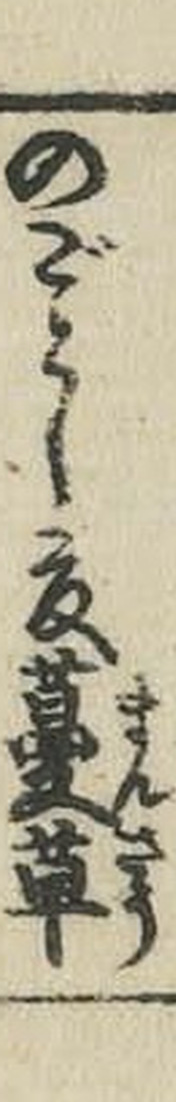のごとし夏蔓草
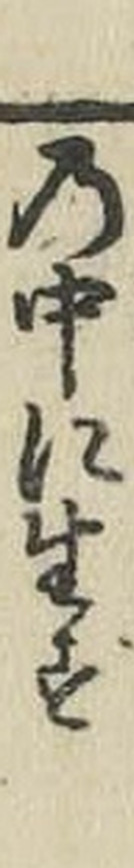の中に生す
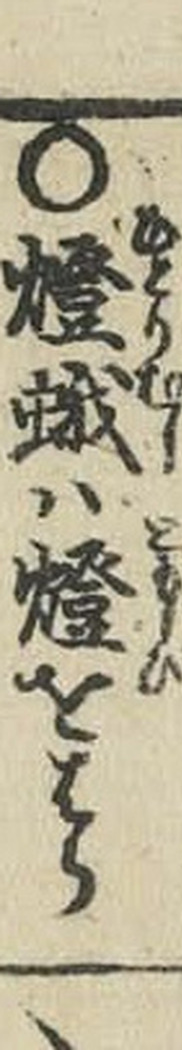○灯蛾は燈をはら
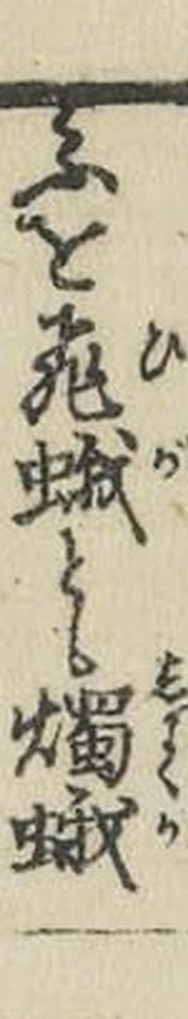ふを飛蛾とも燭蛾
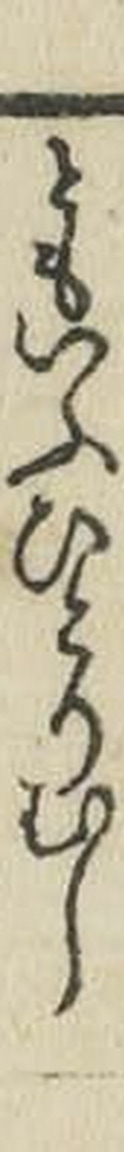ともいふひとりむし
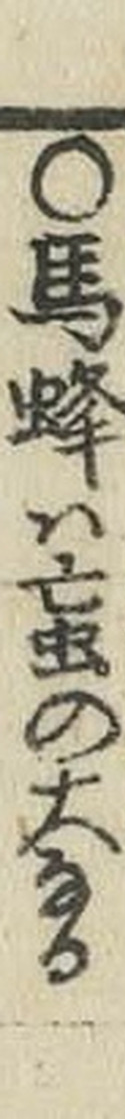○馬蜂は虻の大なる
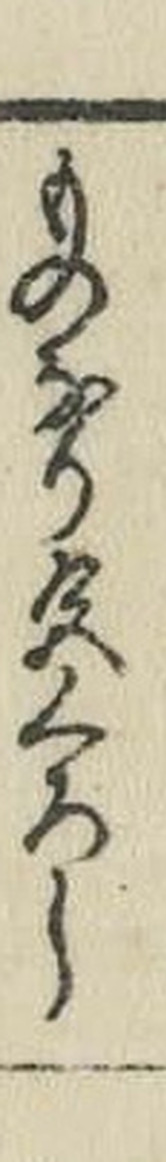ものなり色くろし
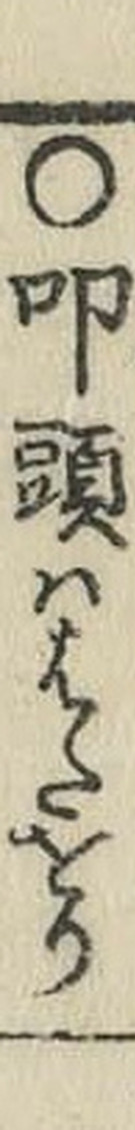○叩頭ははたをり
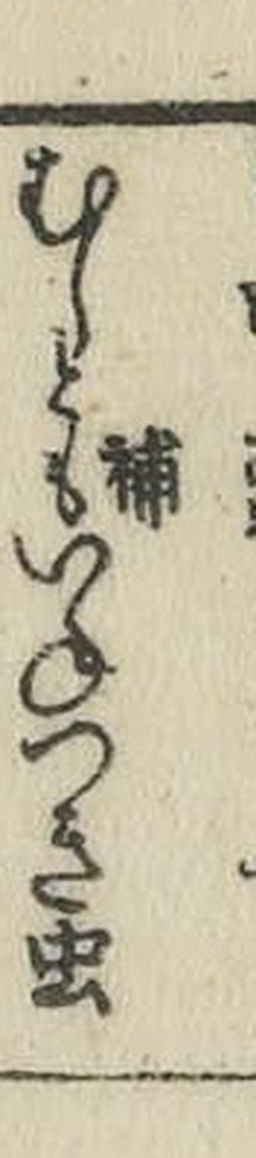むしともいねつき虫
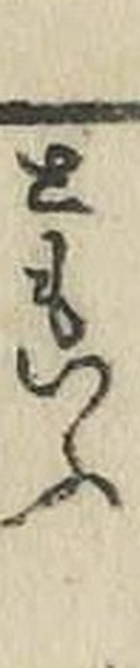ともいふ
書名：増補頭書訓蒙図彙大成 10巻 7:巻之14-16
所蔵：東京学芸大学教育コンテンツアーカイブ
